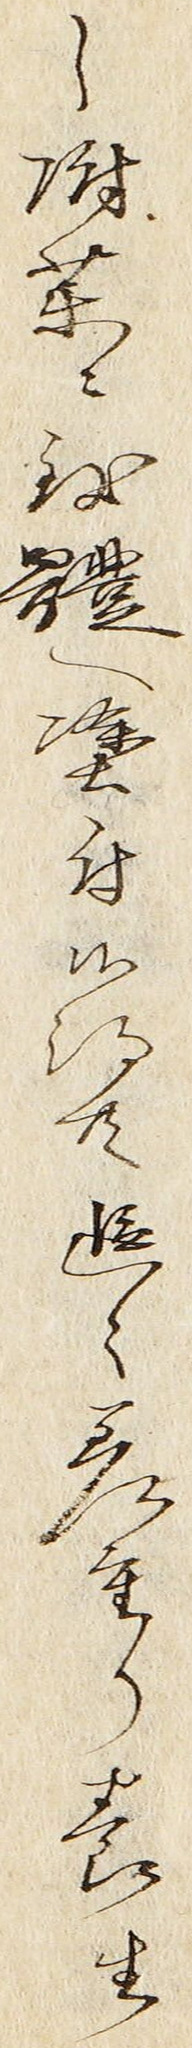し附薬に致体へ塗付候得共追々差重り養生
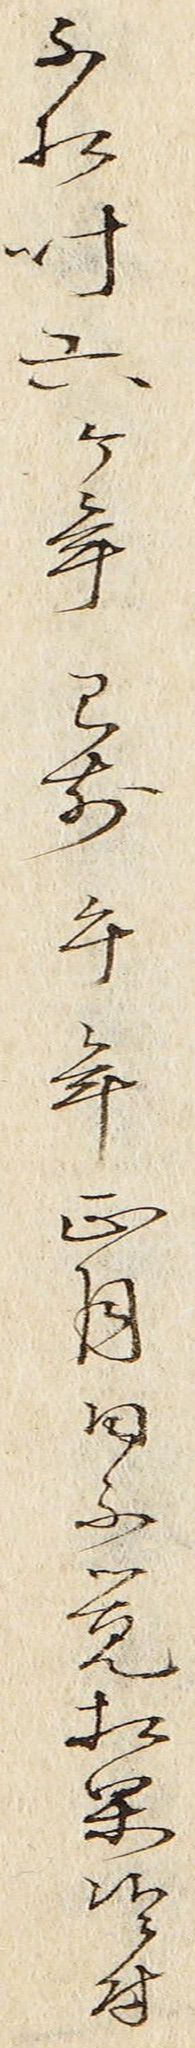不相叶六ヶ年已前午年正月日不覚相果候に付
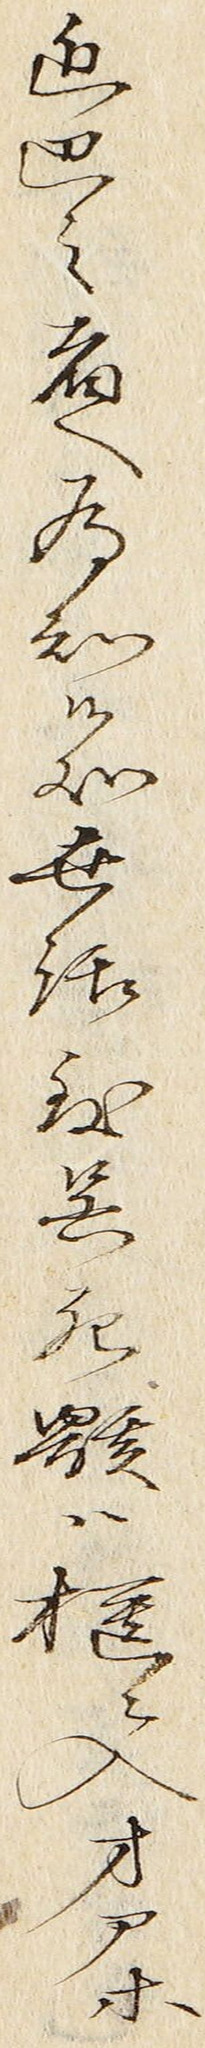近辺之者へ為知候処世話致呉死骸は櫃に入オアホ
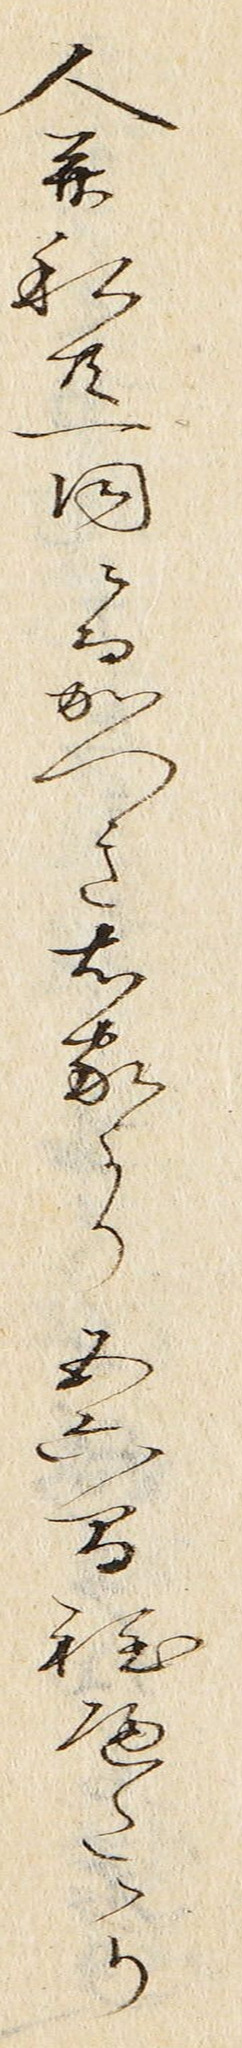人并私共一同に而かつき右家より五六間程へたゝり
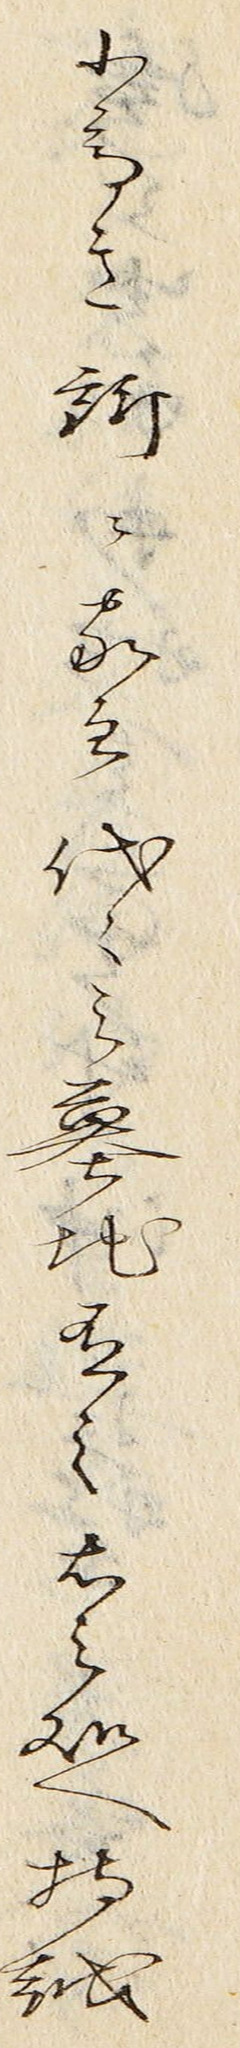小高き所に家主代々之墓地有之右之処へ持越
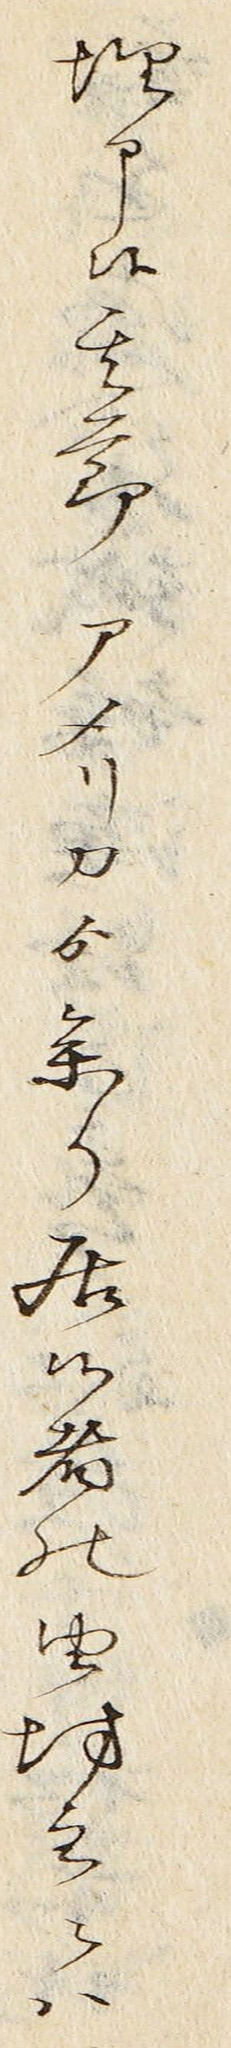埋申候其節アメリカゟ参り居候者之由坊主には
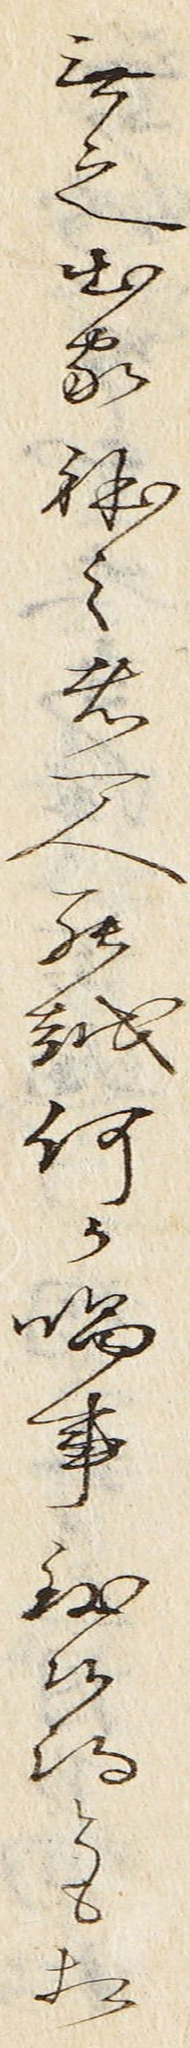無之出家躰之者一人罷越何か唱事致候得とも相
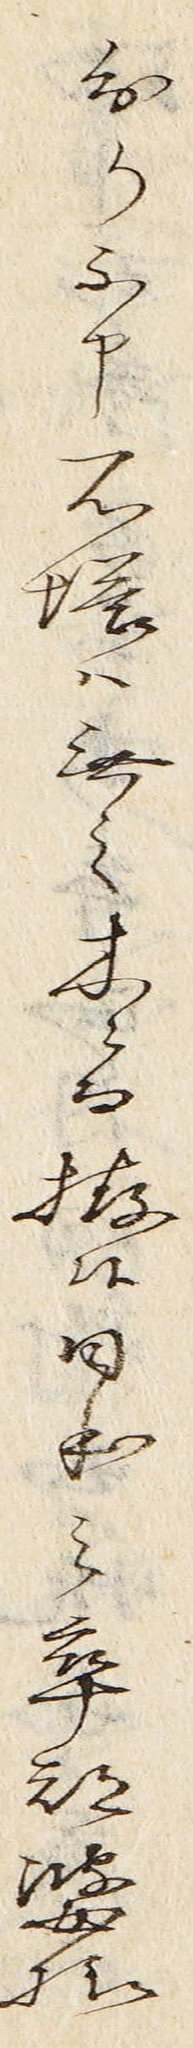分り不申石塔は無之木に而拵候日本之卒塔婆様
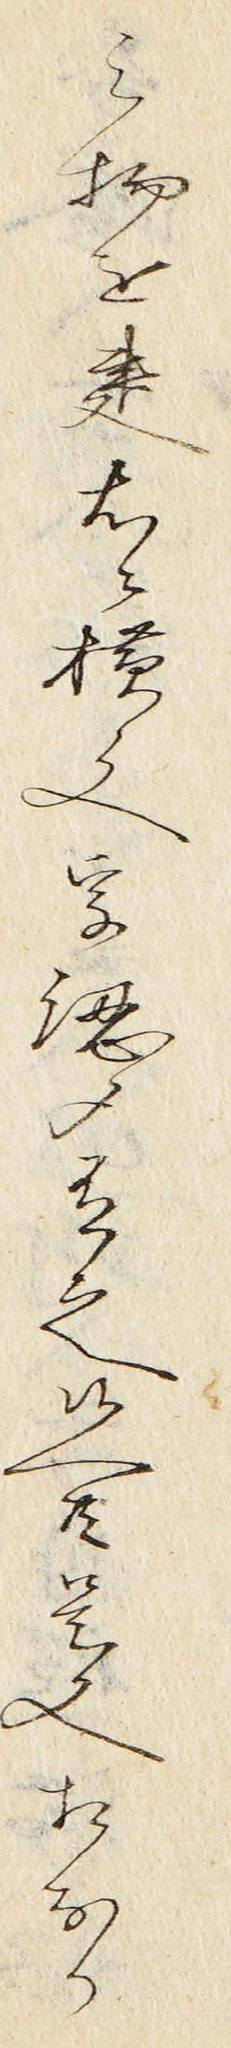之物を建右に横文字認メ有之候得共是又相分り
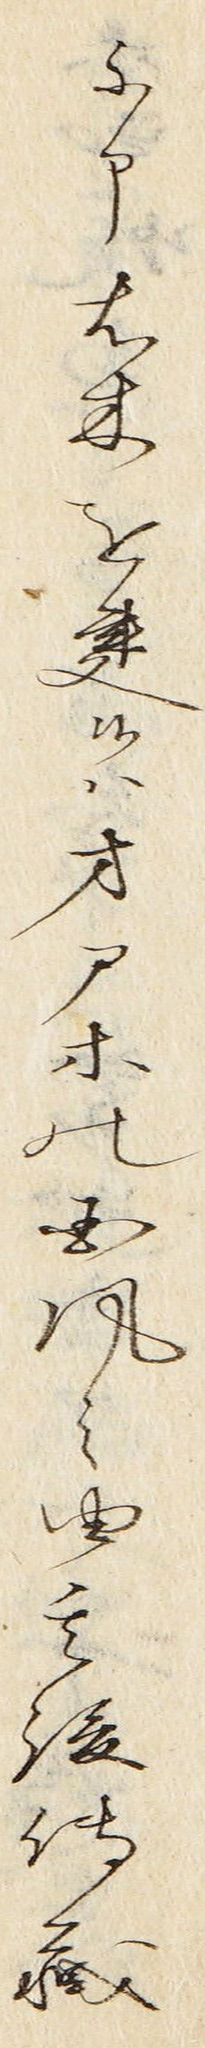不申右木を建候はオアホの国風之由其後伝蔵
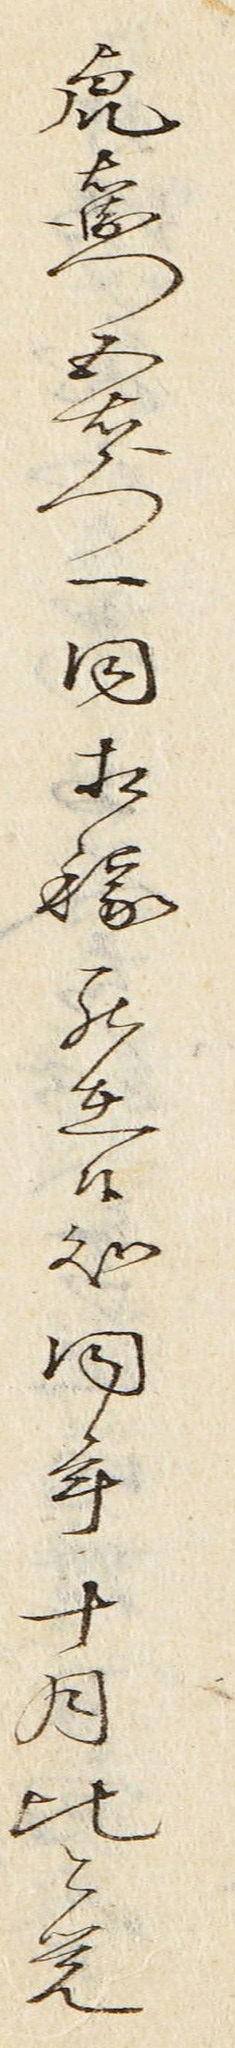虎右衛門五右衛門一同相稼罷在候処ど同年十月比と覚
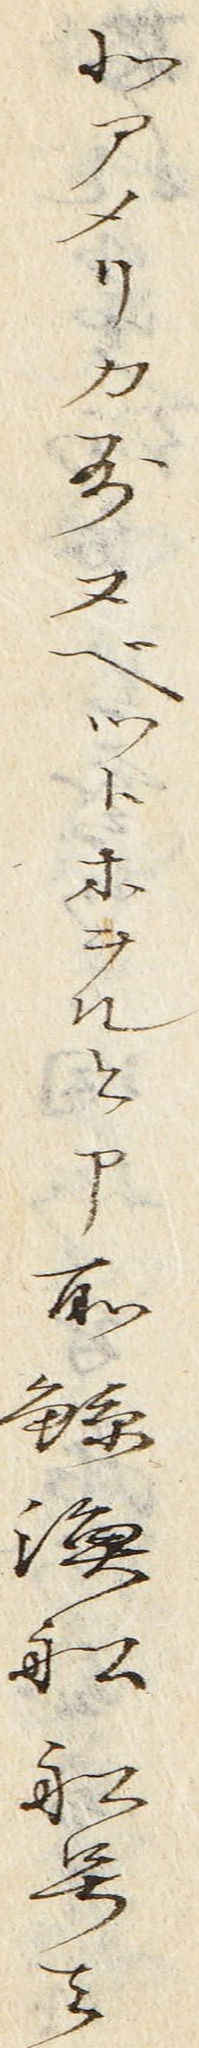北アメリカ州ヌベツトホヲルと申所鯨漁船船号は
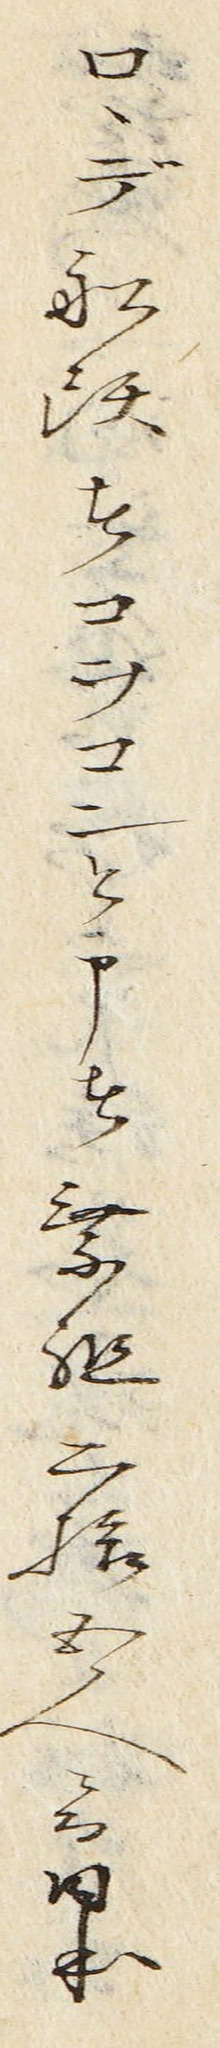ロヽデ船頭はコウコンと申は乗組二拾五人に而日本
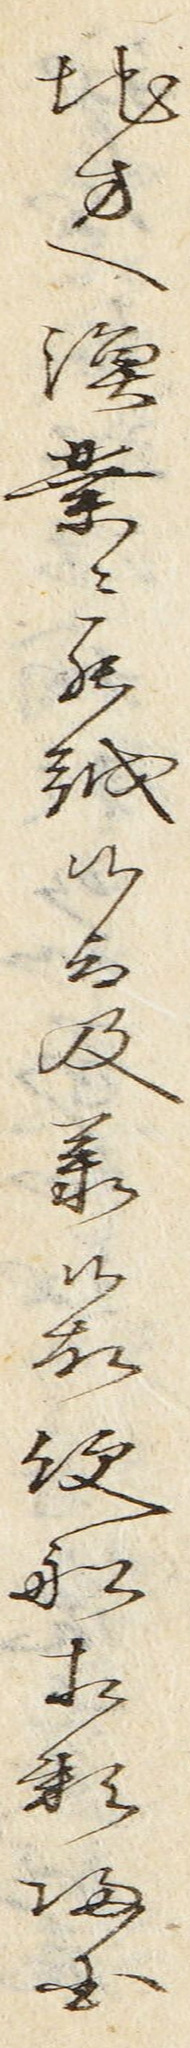地方へ漁業に罷越候旨及承候故便船相頼帰国

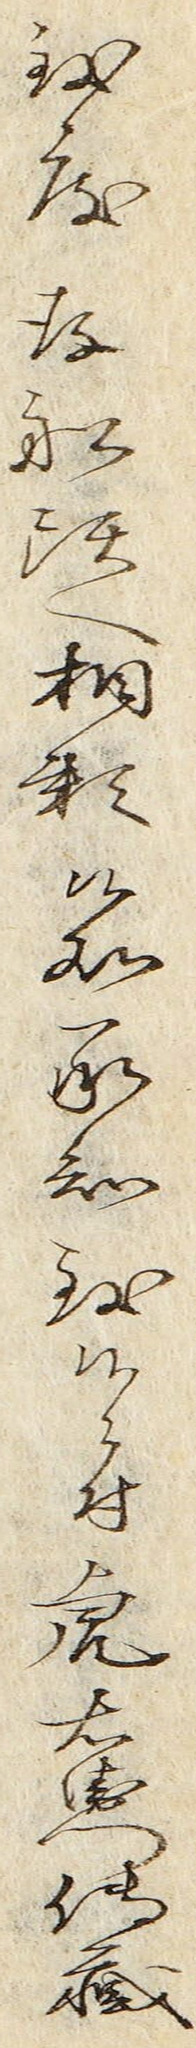致度存船頭へ相頼候処承知致候に付虎右衛門伝蔵
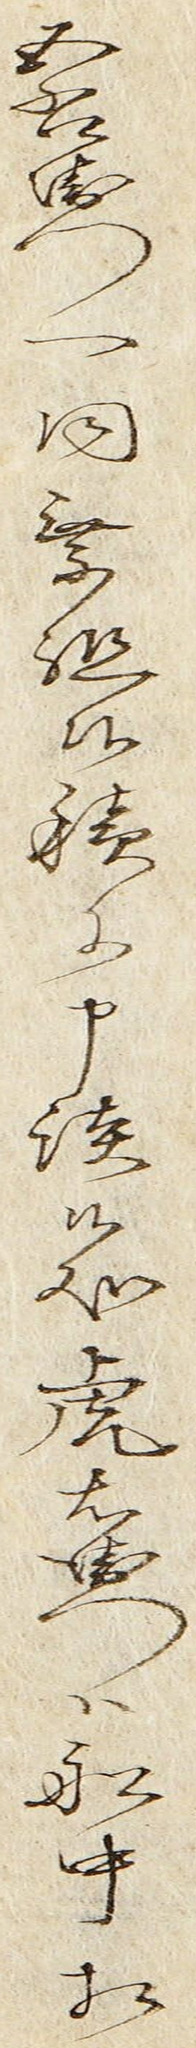五右衛門一同乗組候積に申談候処虎右衛門は船中相
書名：土佐中浜万次郎漂流記
